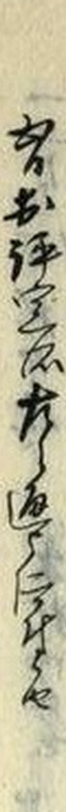五日於評定所左之通被仰付候由
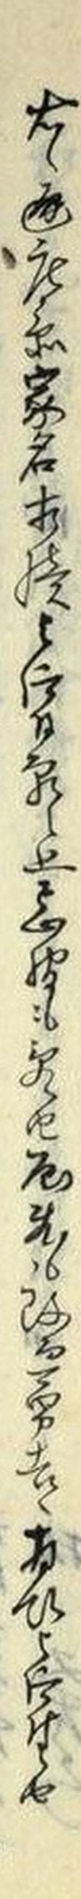右之通庄兵衛家名相続被仰付願之上忌服も受候由屋敷も改而勇吉へ拝領被仰付候由
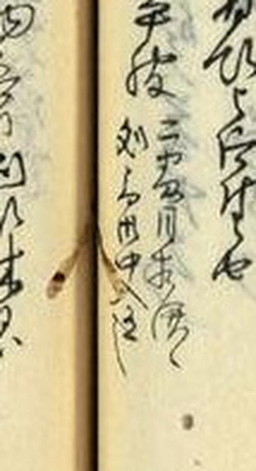処ニ而中入有之
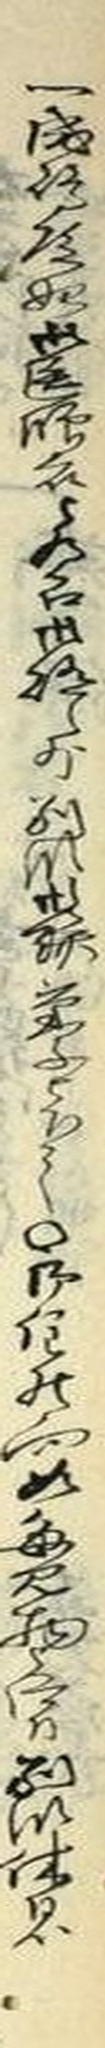一成嶋殿始御医師衆被為召御賄之外別段御餅菓子被下之〇御住居向如毎見物被仰付別段休息
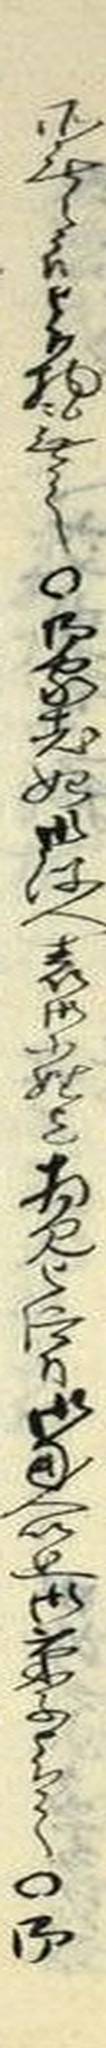所無之ニ付被下物も無之〇御家老始御役人表御小姓迄拝見被仰付御用人以上御菓子被下之〇御
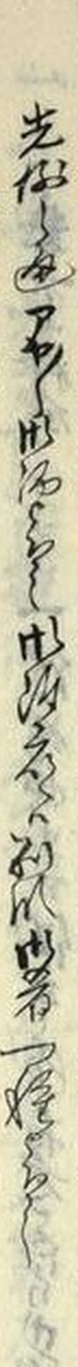先例之通部屋〱御酒被下之御附衆ヘハ別段御肴一種被下之
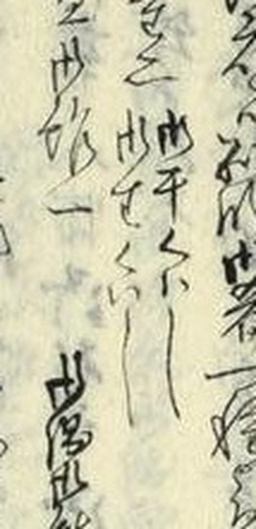御生くハし
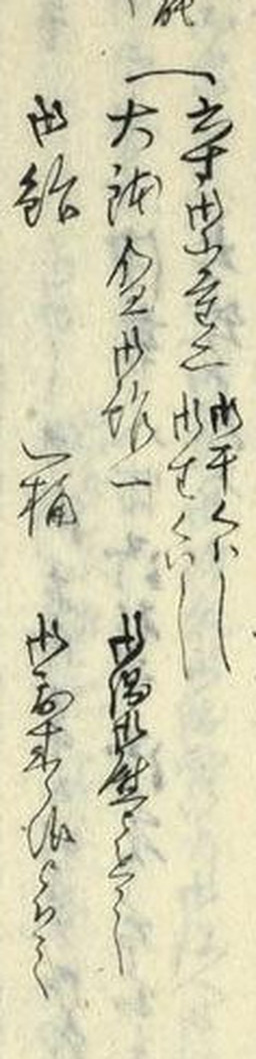大鉢盛御鮓一御側御慰被進之
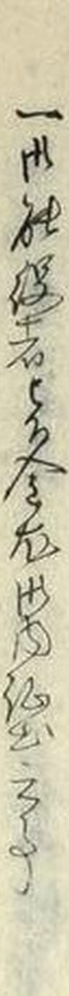一御能役者被下金尤御内証出之事
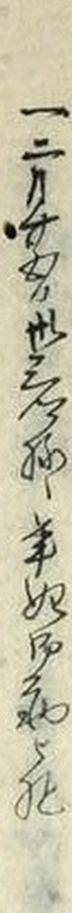一二月廿五日御三卿様へ年始御勤被遊
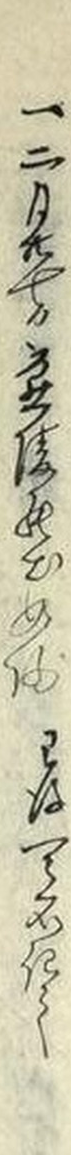一二月廿七日燕凌罷出如例已後一々不記之
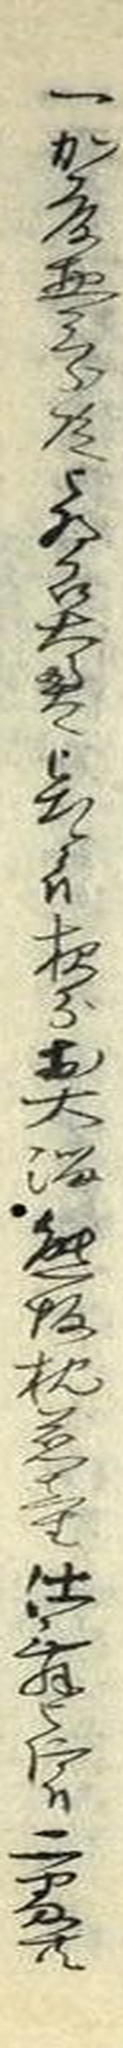一加藤惣三郎殿被為召大奥へ被出候ニ付夜分於大溜熊坂枕慈童仕舞被仰付二番共
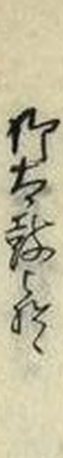御太鼓被遊候
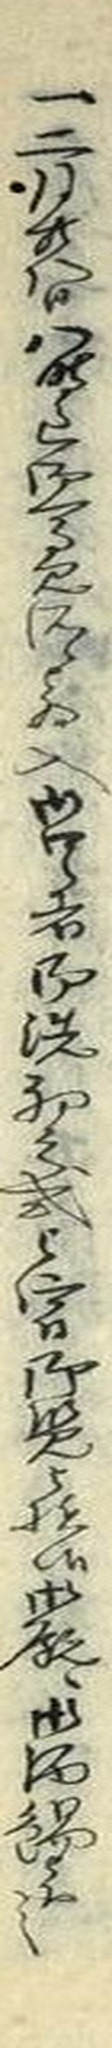一二月廿八日八時過御馬見所へ被為入御口之者御洗初之式被仰付御覧被遊候御厩へ御酒鯣被下之

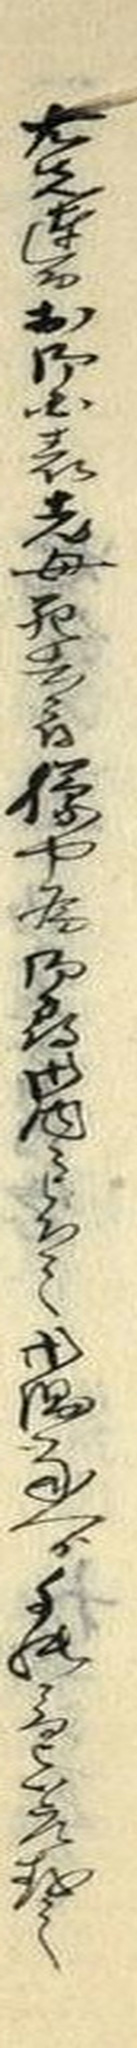右先達而於御国表老母死去ニ付朦中為御尋御内々被下之御側御用人ゟ手紙ニ而被差越之
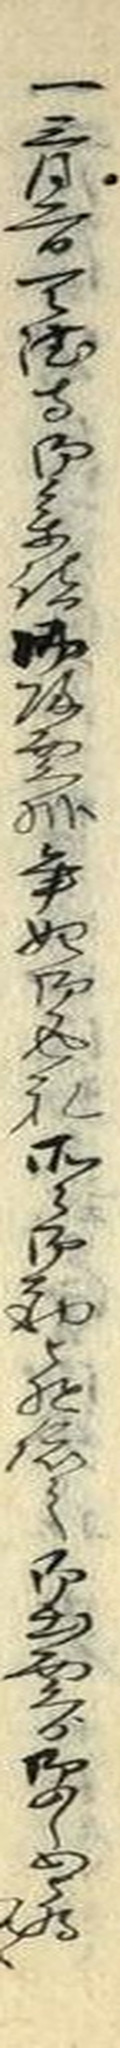一三月二日天徳寺御参詣御帰殿掛年始御返礼所々御勤被遊依之御出殿ゟ御のしめ被為召候
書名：少傅日録抄（斉善付側向頭取日記、在府）
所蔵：福井県文書館 Fukui Prefectural Archives
